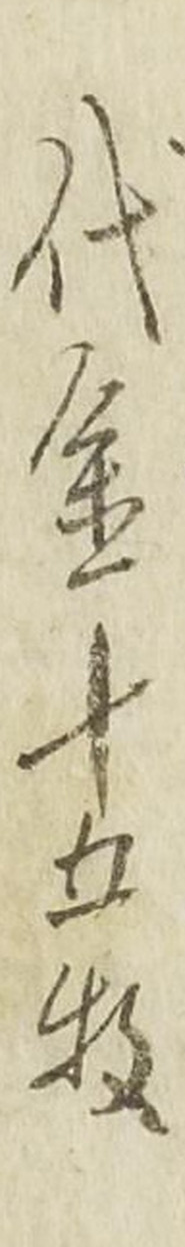代金十五枚

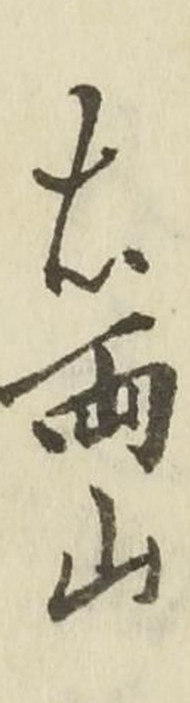右両山
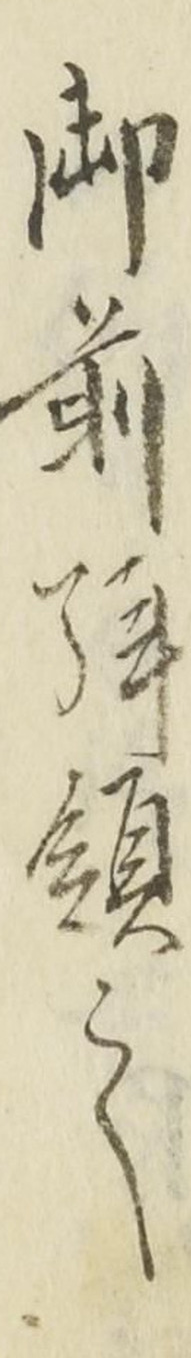御前拝領之
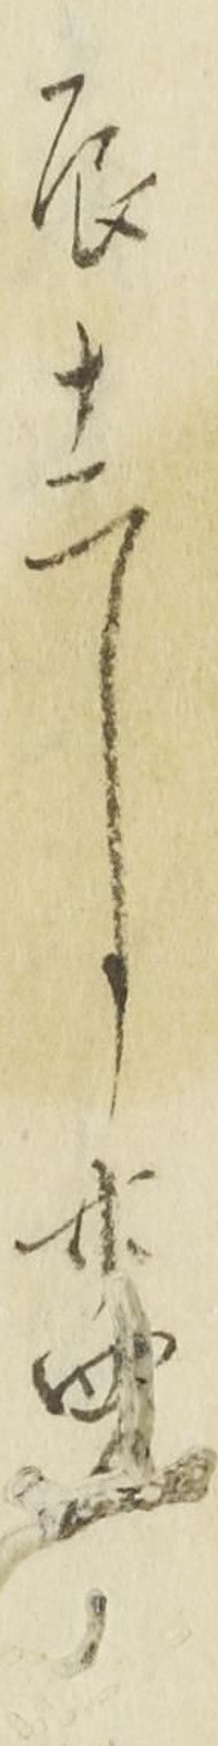辰十二月廿四日
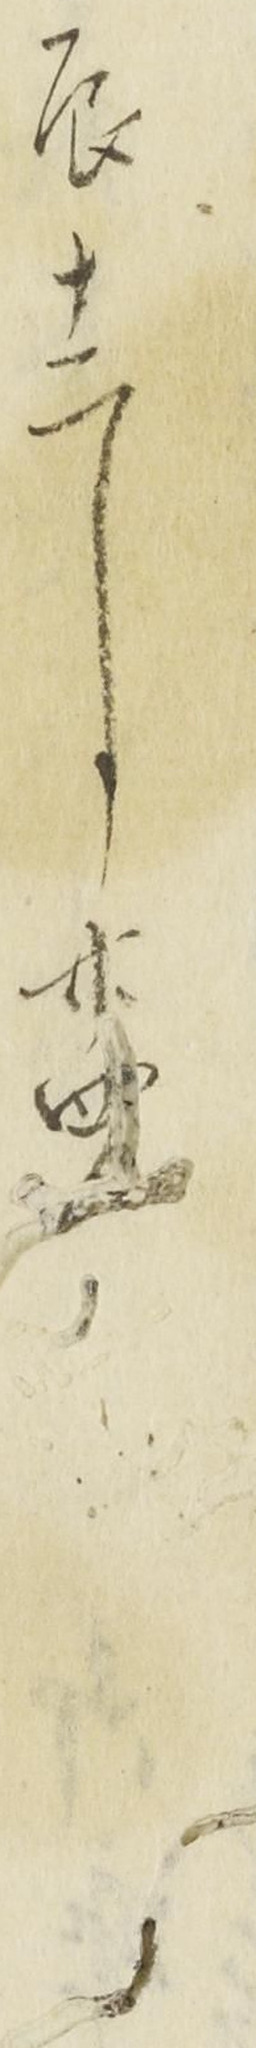辰十二月廿四日
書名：安政二乙卯年十月二日大地震之事
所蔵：東京大学地震研究所図書室 Earthquake Research Institute Library, The University of Tokyo, JAPAN
